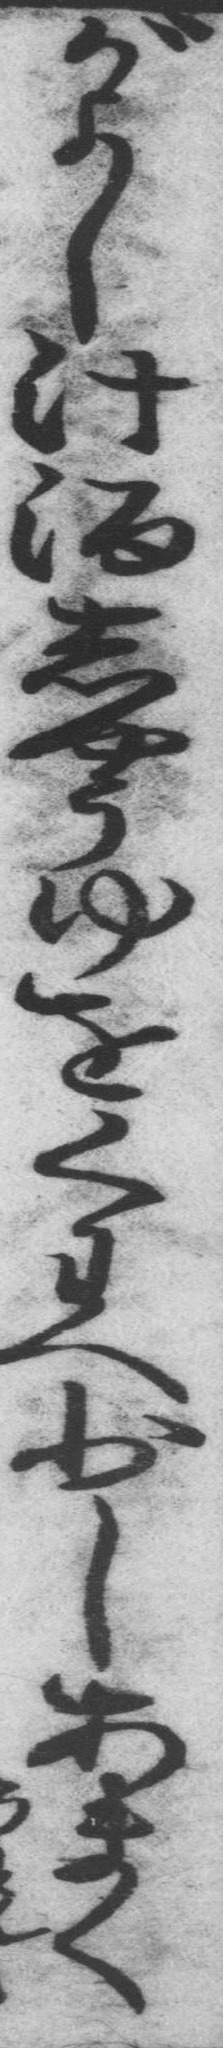がよし汁酒しやうゆをくわへ少しあまく
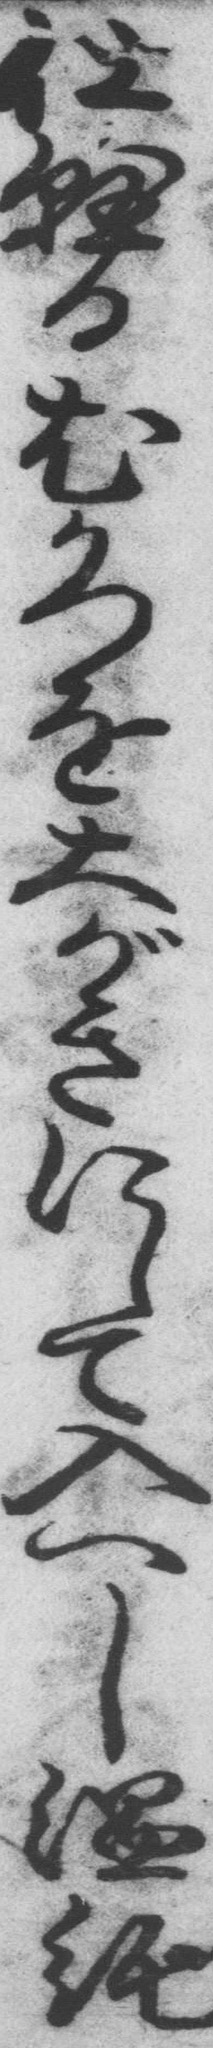仕懸る尤かつを大がきにして入へし饂飩
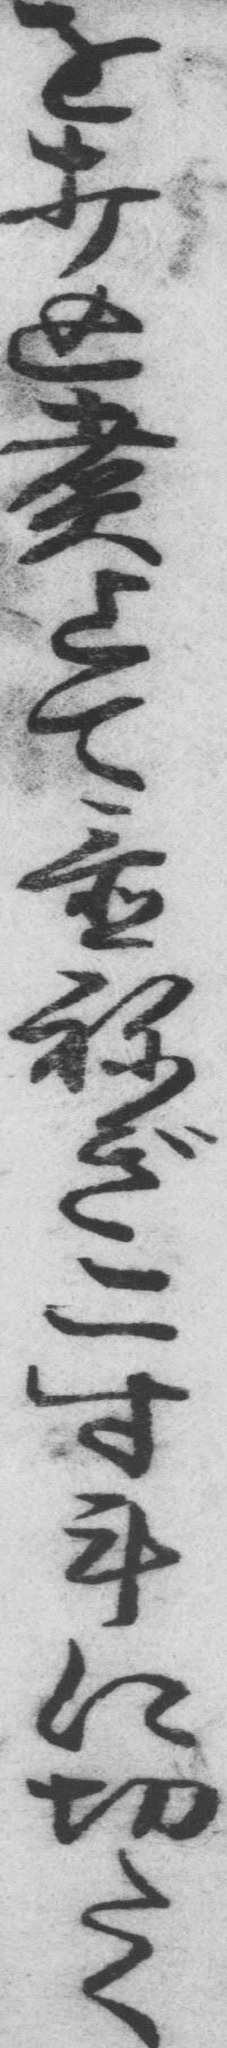を打込煮上て置ねぎ二寸斗に切たく
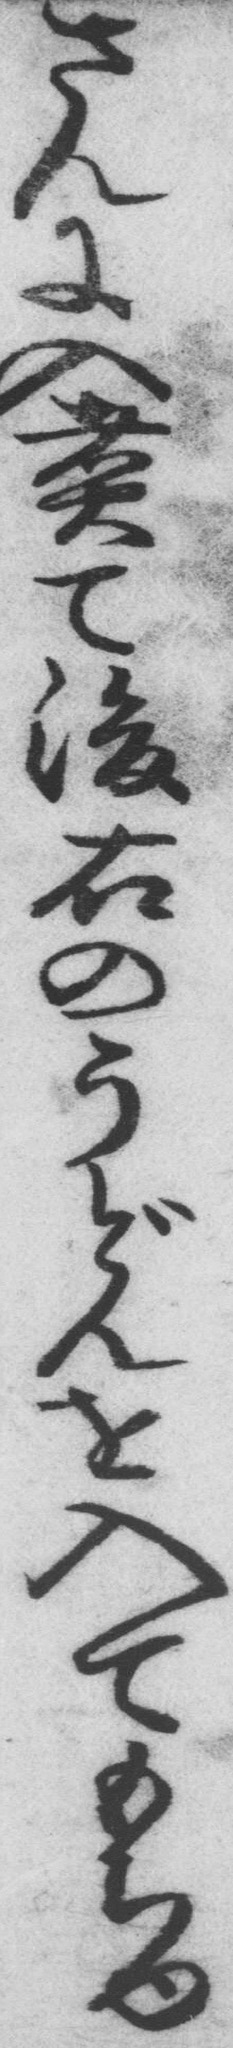さんに入煮て後右のうどんを入てもちゆ
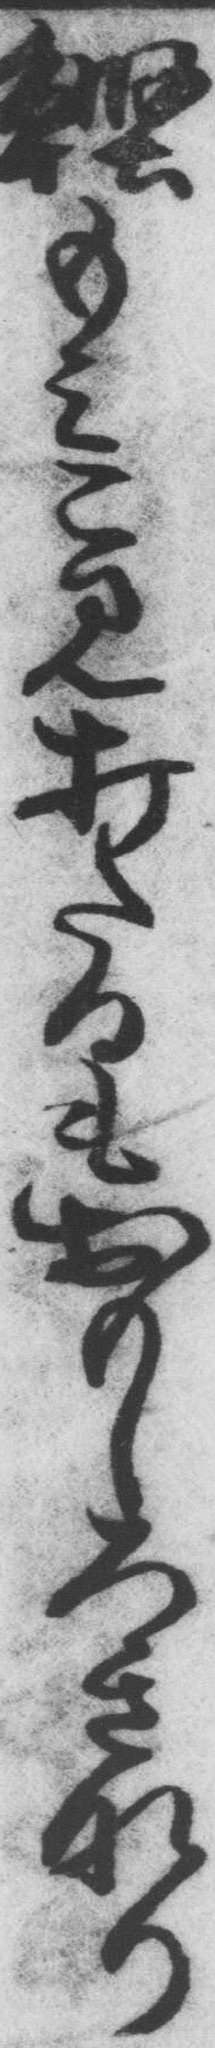鰹もみこみ打たるもおもしろきなり
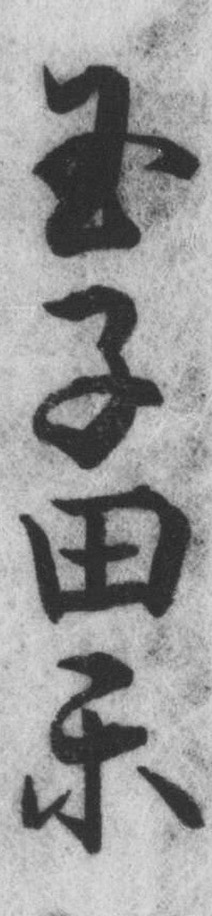玉子田楽
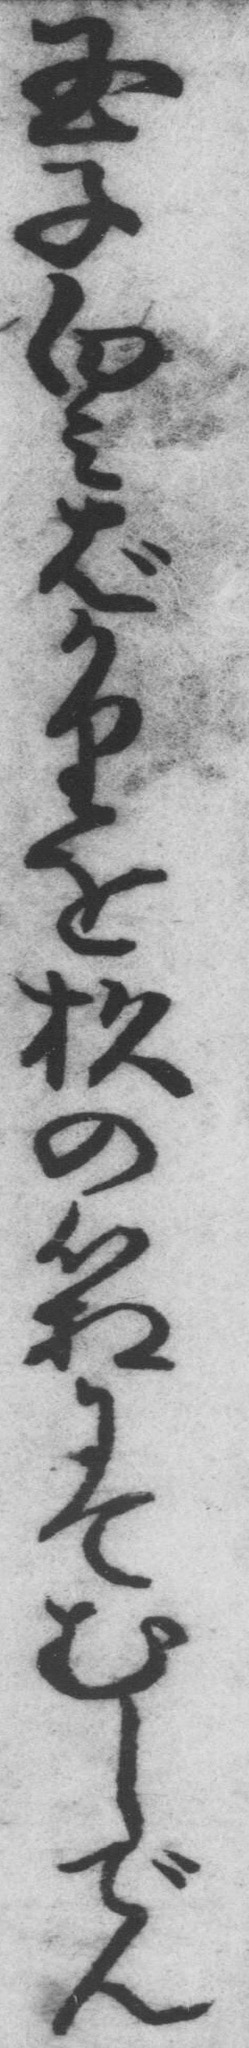玉子白みばかりを杉の箱にてむしでん
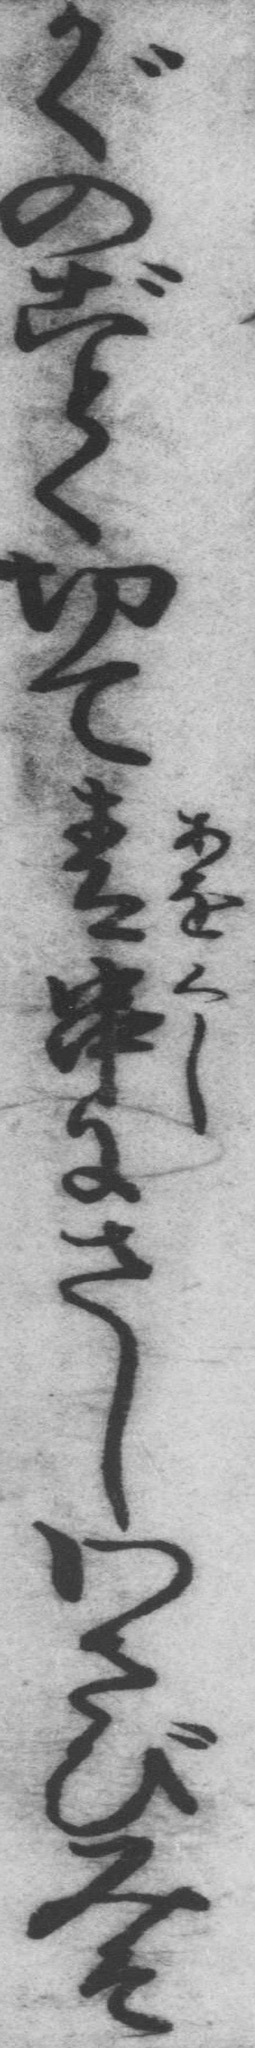がくのごとく切て青串にさしわさびみそ

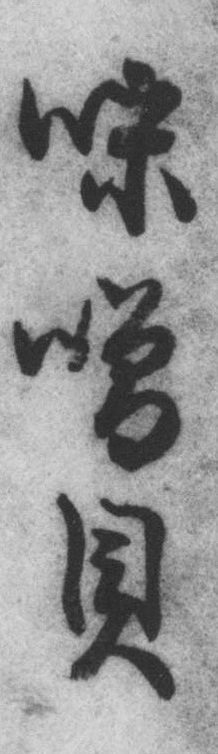味噌貝
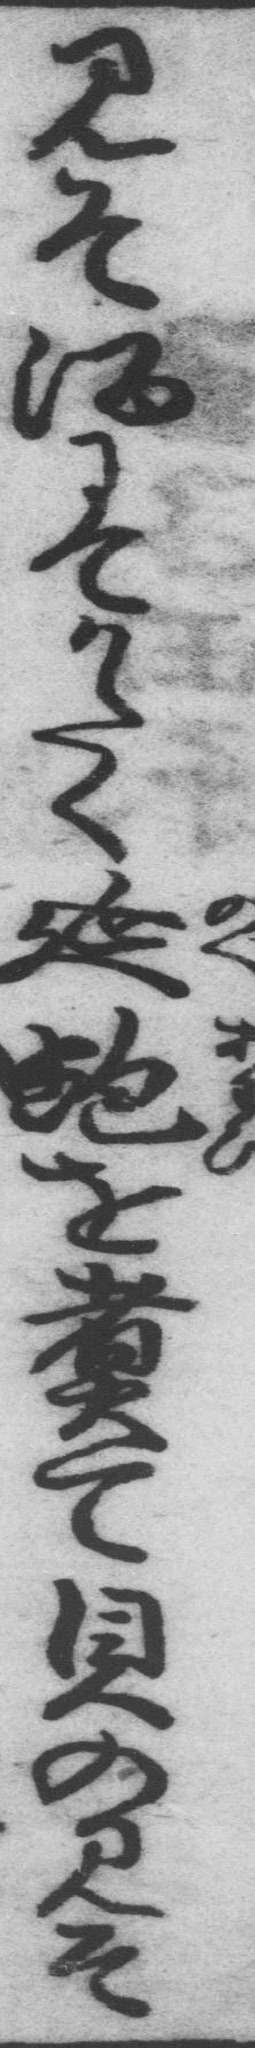みそ酒にてかたく延鮑を煮て貝のみそ
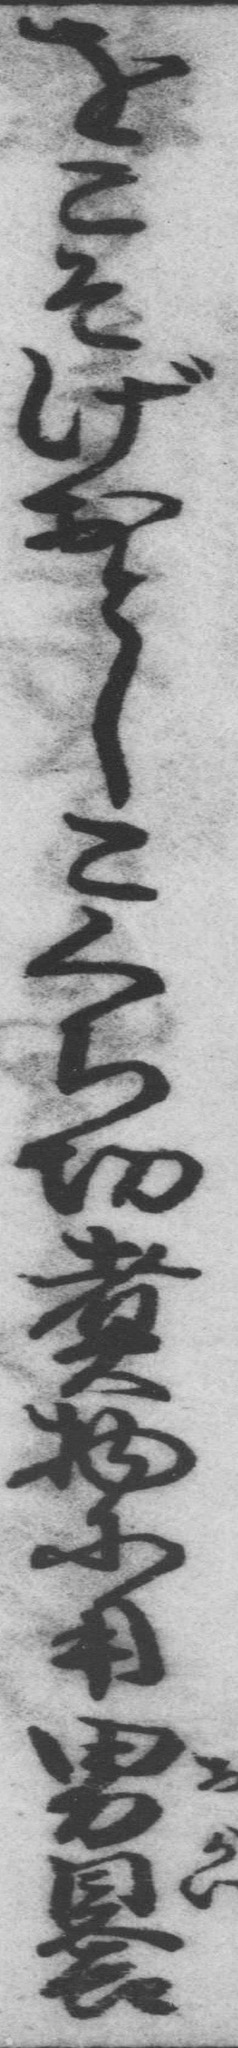をこそげおとしこくち切煮物に用男貝共
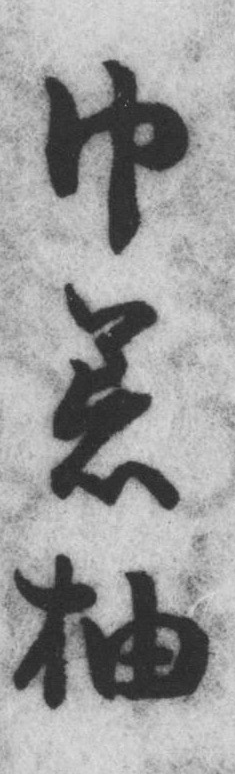巾着柚
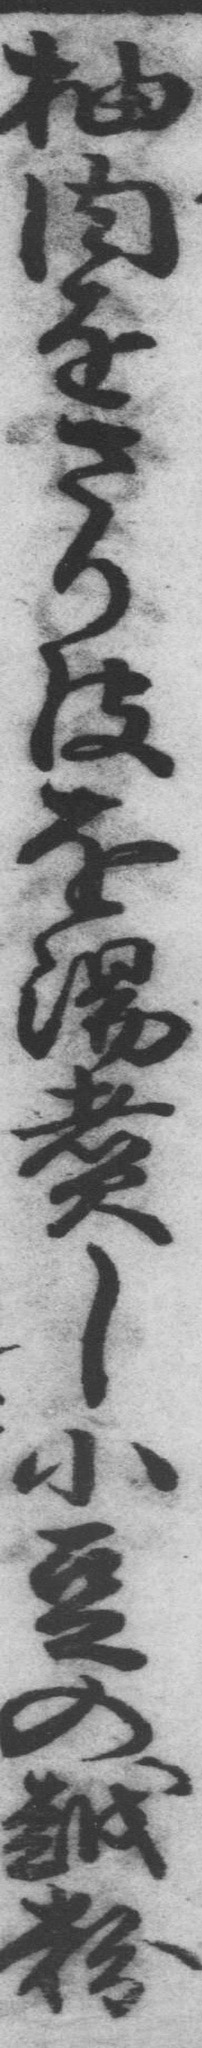柚肉をさり皮を湯煮し小豆の越粉
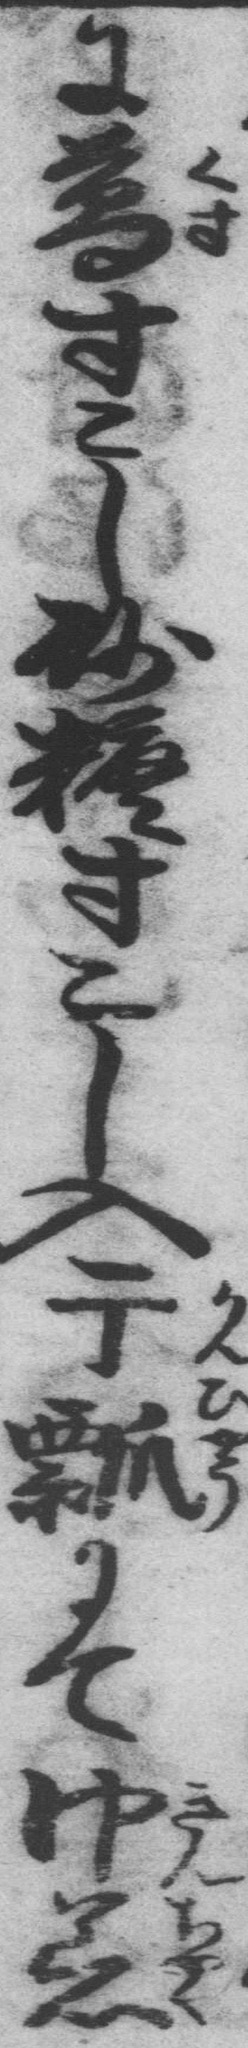に葛すこし砂糖すこし入干瓢にて巾着
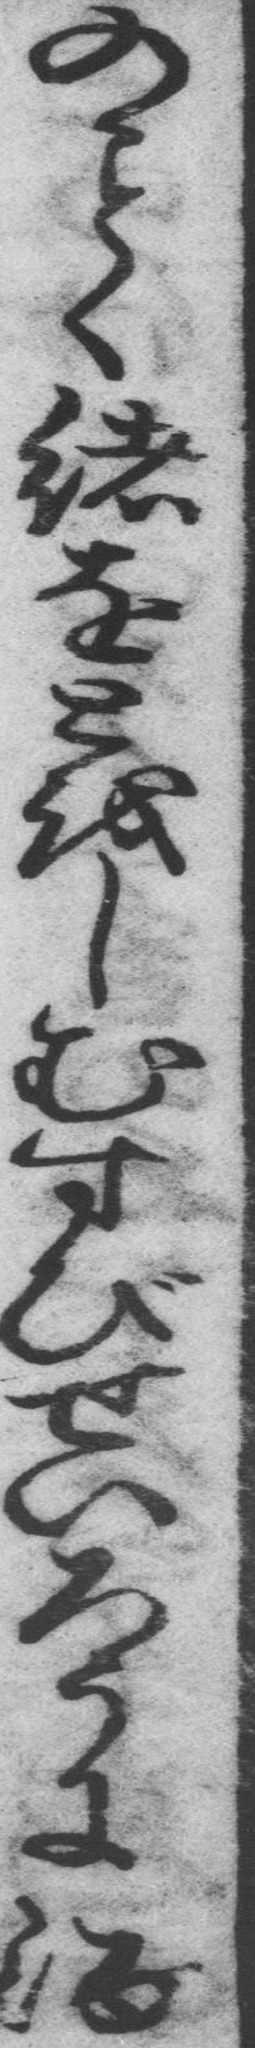のことく緒をとをしむすびせいろうに酒
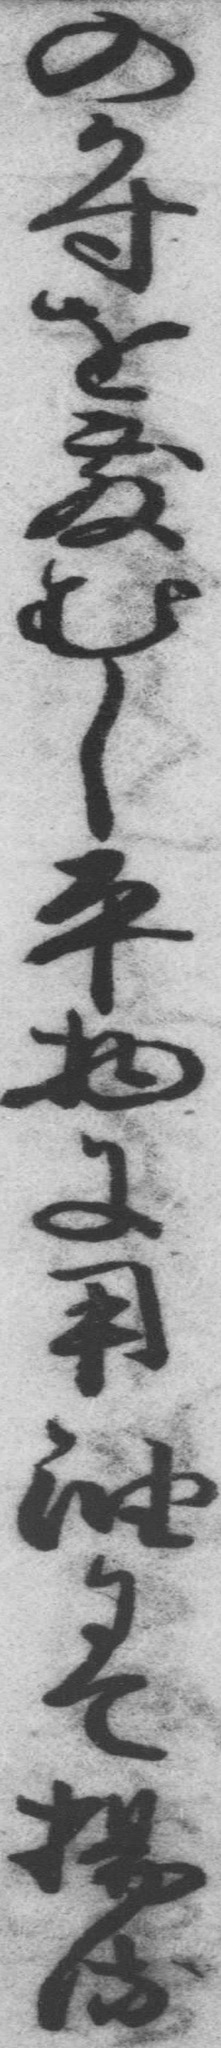のかすを敷むし平物に用油にて揚る
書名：料理山海郷
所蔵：大阪府立大学学術情報センター 国文学研究資料館
